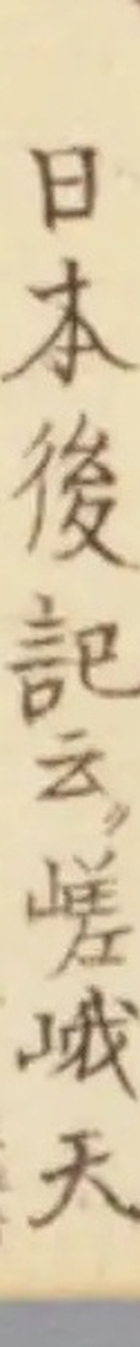日本後記云嵯峨天
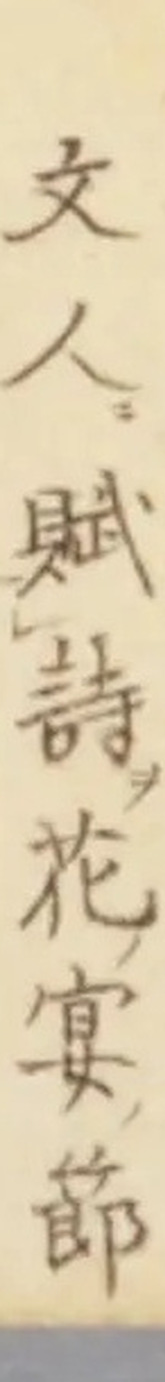文人ニ賦詩ヲ花ノ宴ノ節
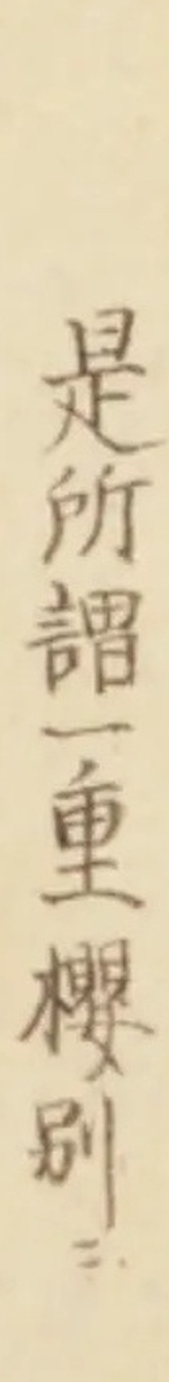是所謂一重桜別
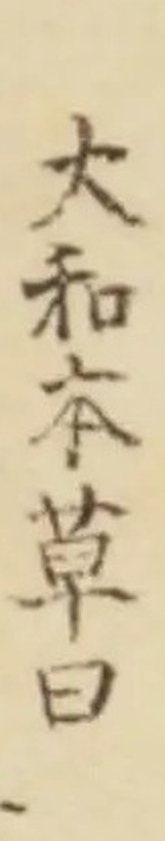大和本草曰
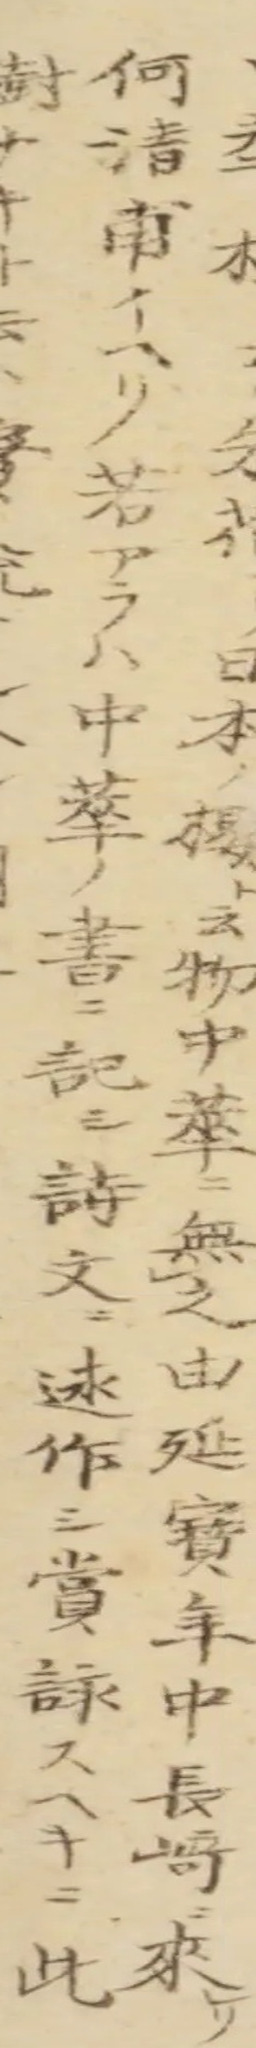何清甫イヘリ若アラハ中華ノ書記詩文述作シ賞詠
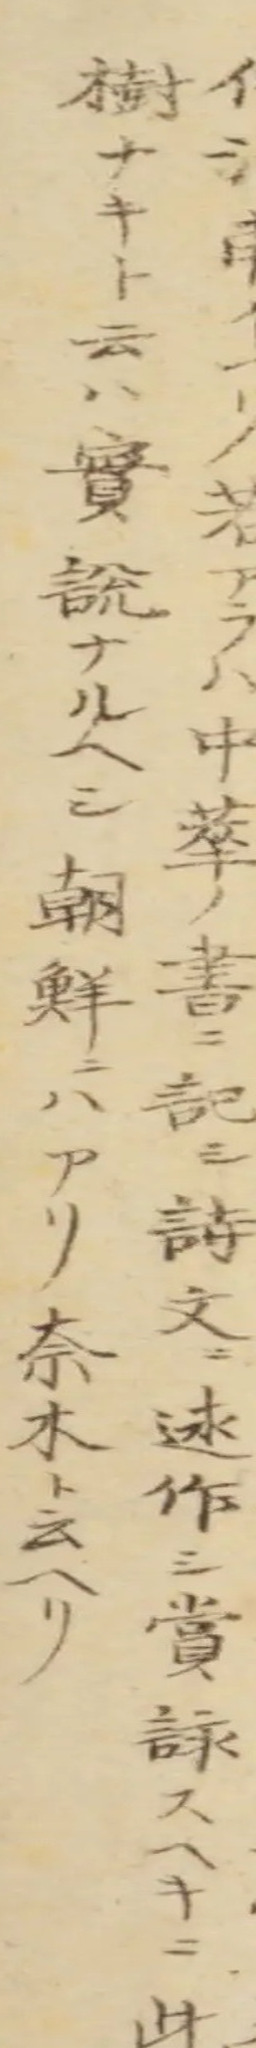樹ナト云ハ実説ナルヘシ朝鮮ハアリ奈木ト云ヘリ

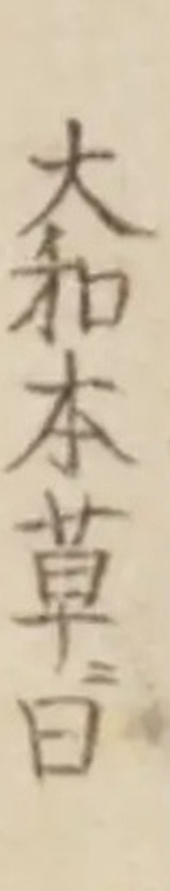大和本草曰
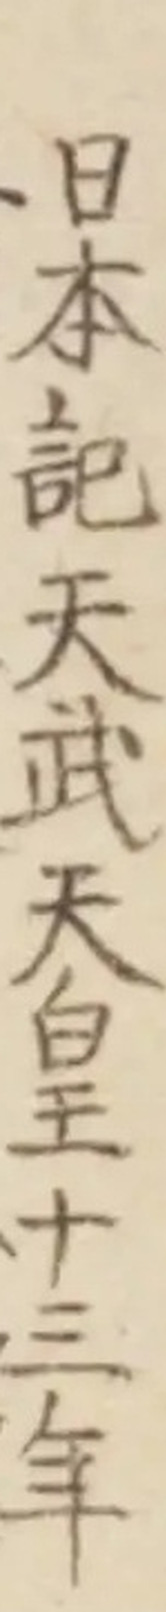日本記天武天皇十三年
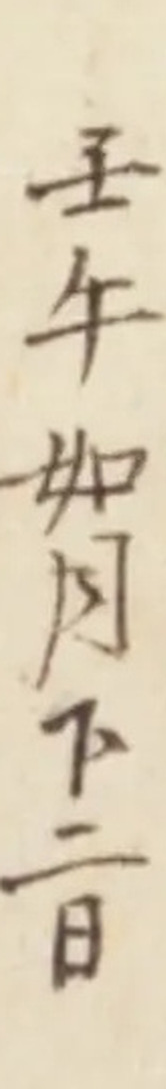壬午如月下二日
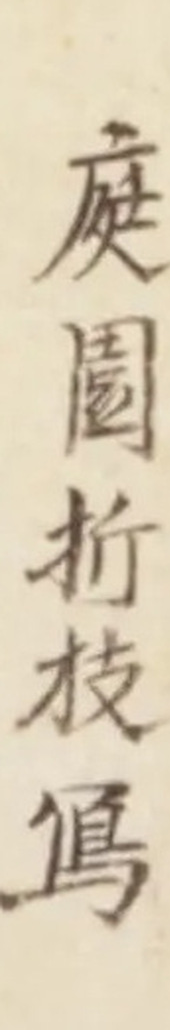庭園折枝写
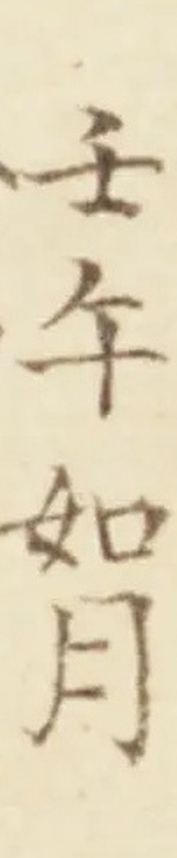壬午如月
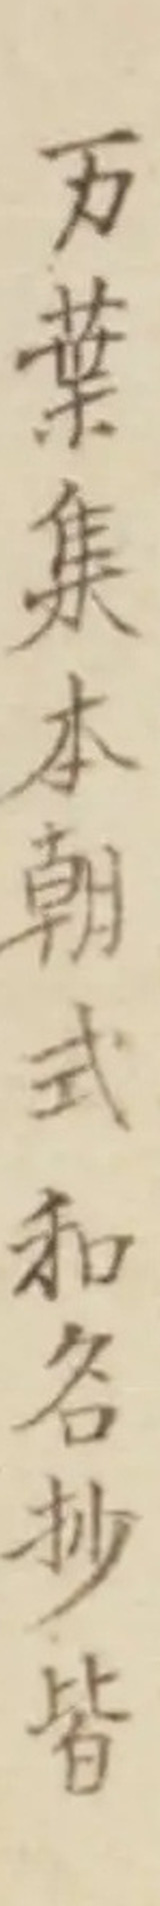万葉集本朝式和名抄皆

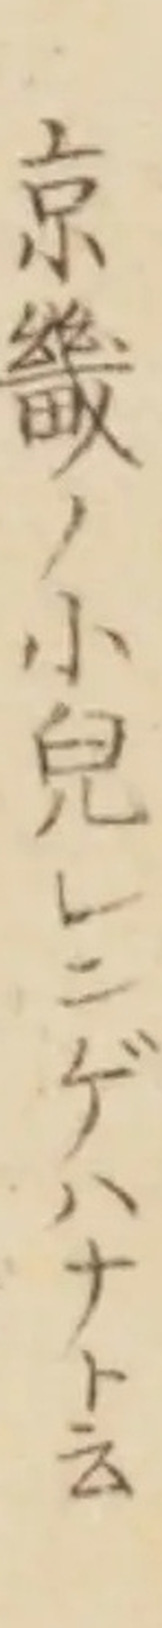京畿ノ小児レンゲバナト云
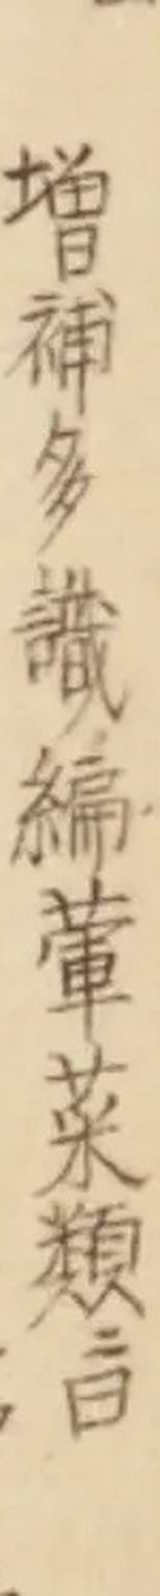増補多識編葷菜類曰
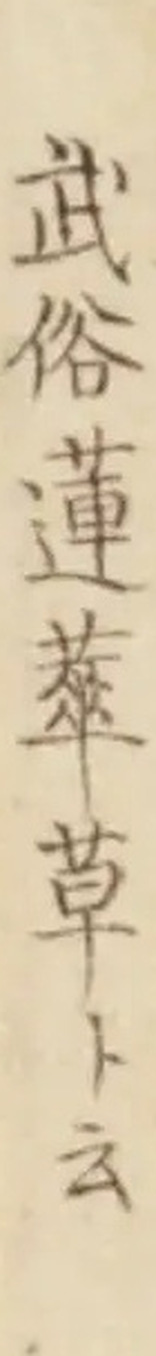武俗蓮華草ト云
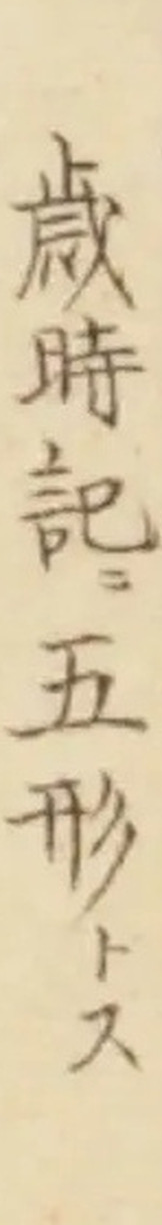歳時記ニ五形トス
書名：梅園草木花譜春之部. 1
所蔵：国立国会図書館 National Diet Library, JAPAN
